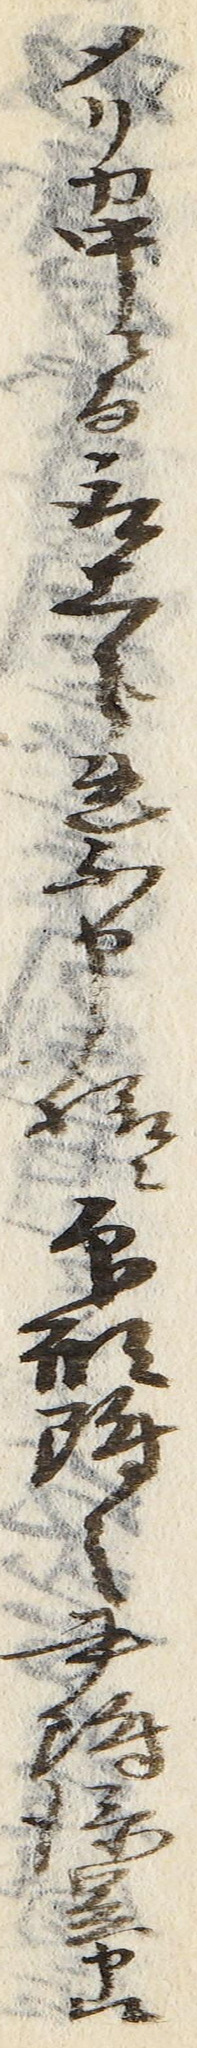メリカ中ニ而取上られ不申様ニ印形附書附添置申候
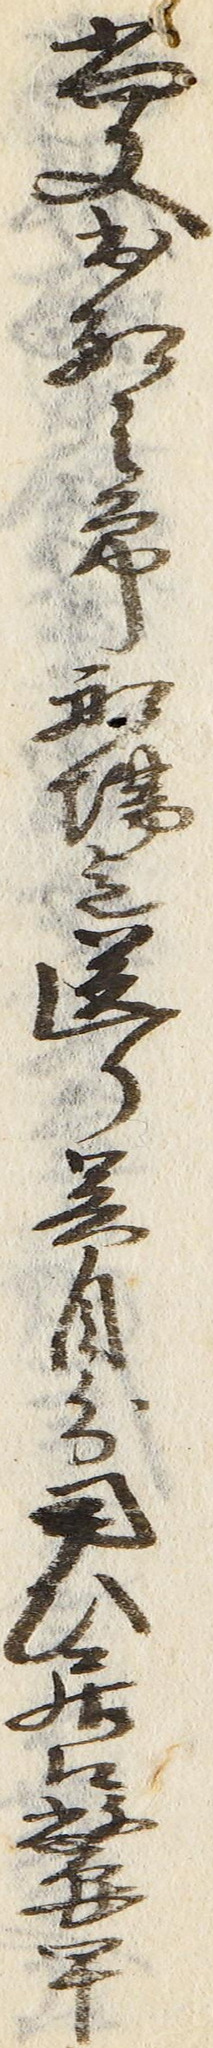尚又出願之節舩塲迄送り呉自分用ひ居候鼈甲
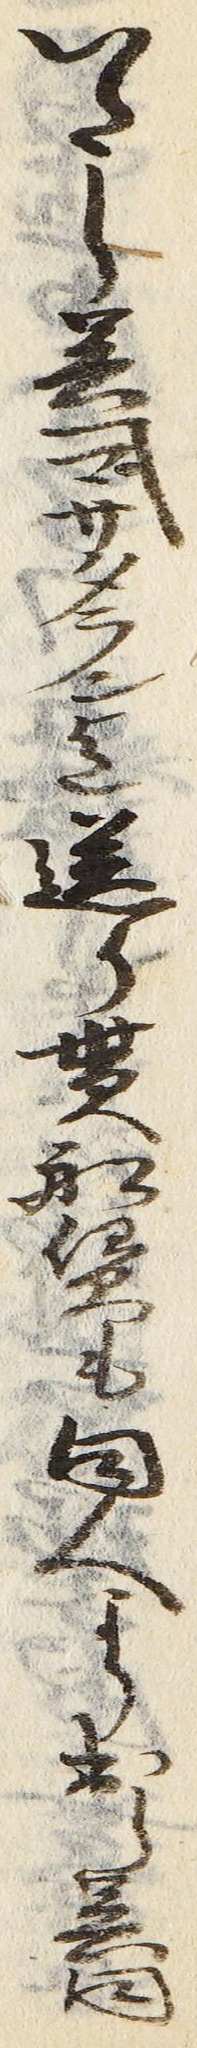いたし呉「マサタラン迄送り貰舩賃も同人より出し呉同
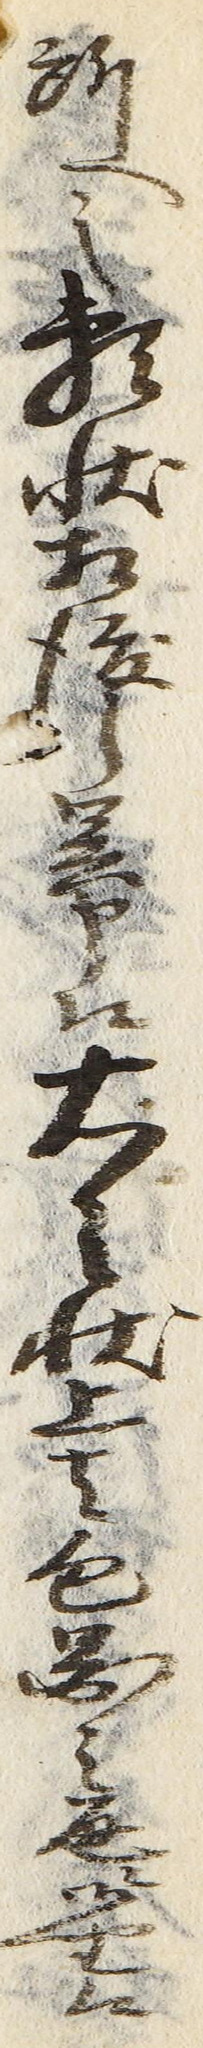所への頼状相渡し呉申候右之状上者包圖之通ニ御座候
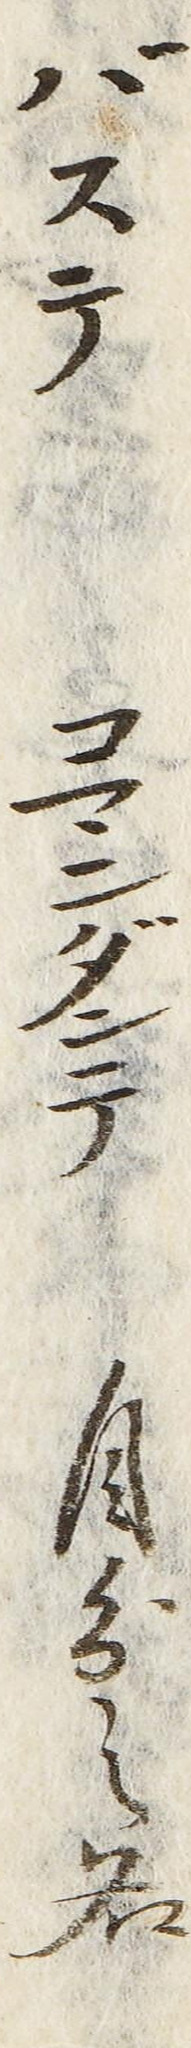バステコマンダンテ自分之名
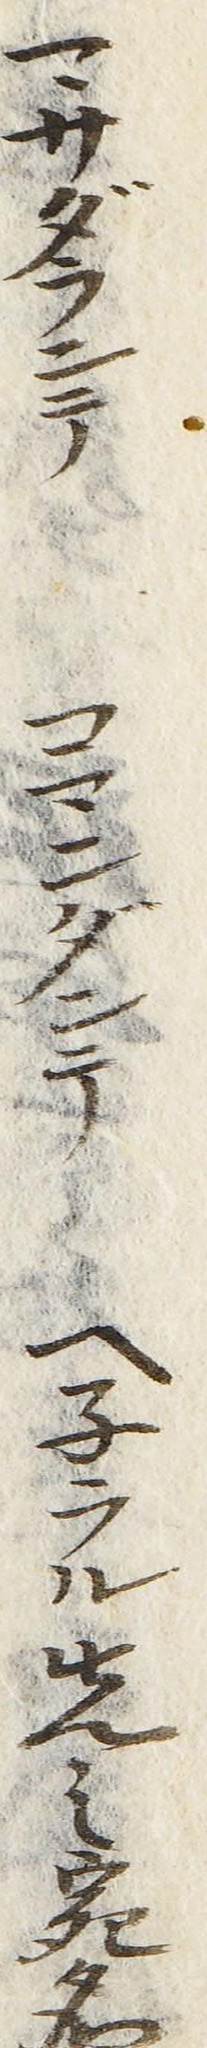マサダランテコマンダンテヘ子ラル先之宛名
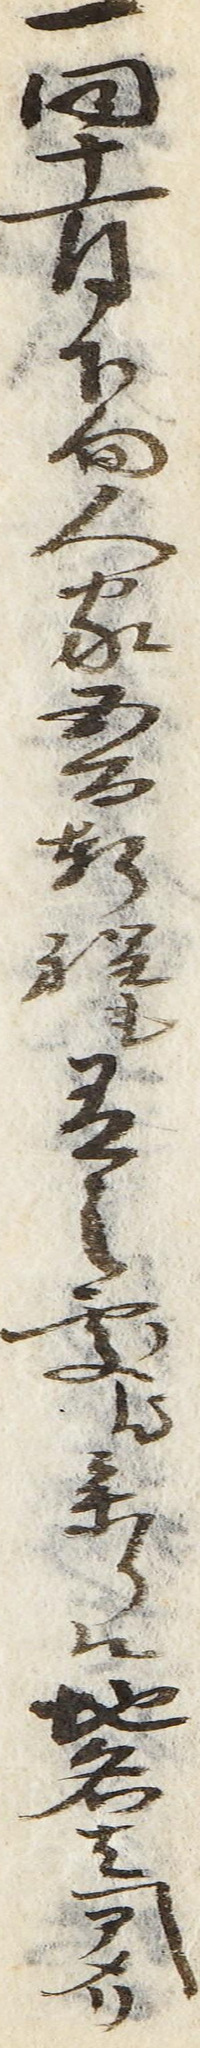一同十一月下旬人家五百軒程も有之處江参り候地名者「アメリ
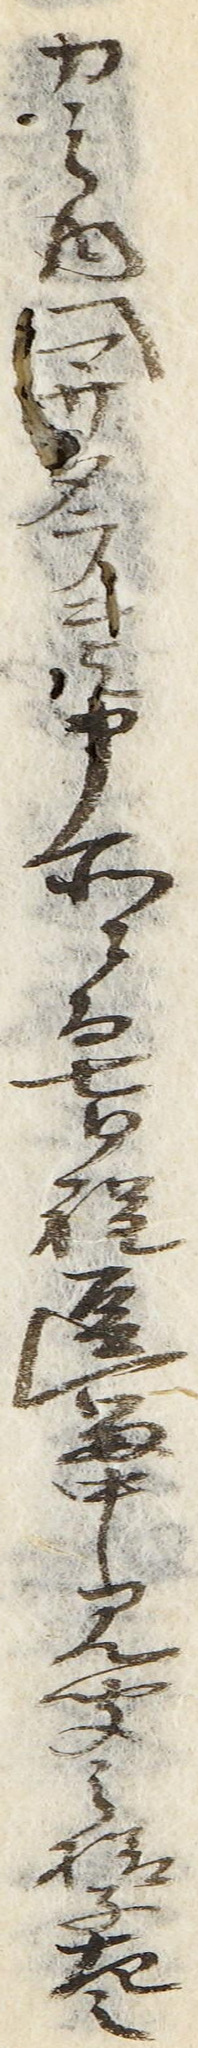カ之内「マサタラニと申所ニ而七日程逗留中見聞之様子左之
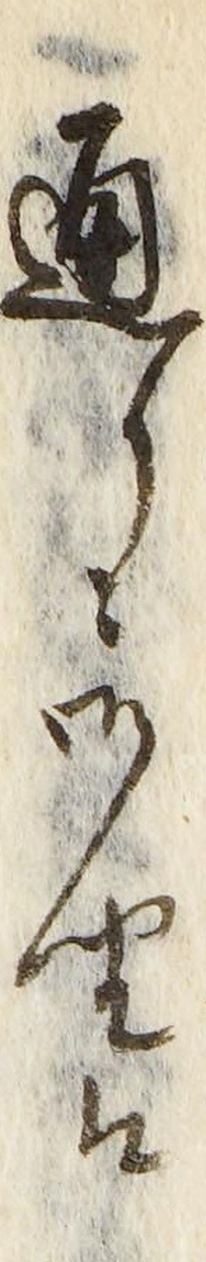通りニ御座候
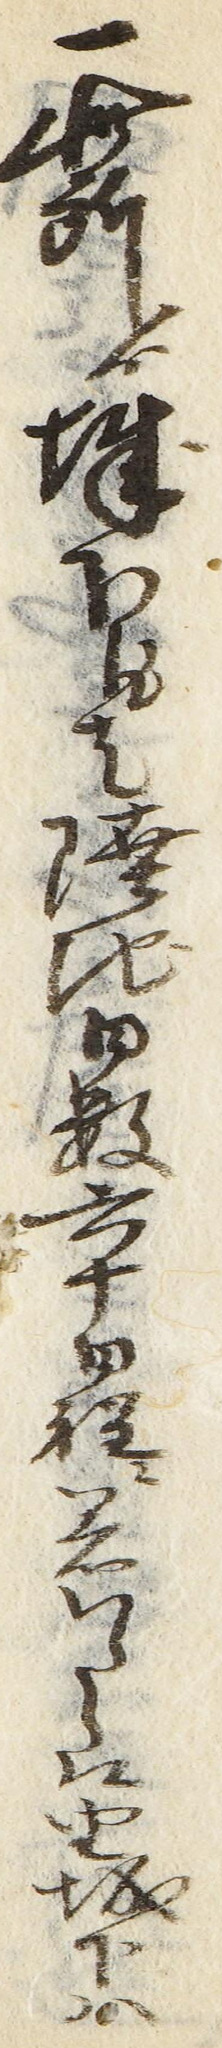一此所ゟ城下江者陸地日数六十日程ニ着いたし候由城下ハ

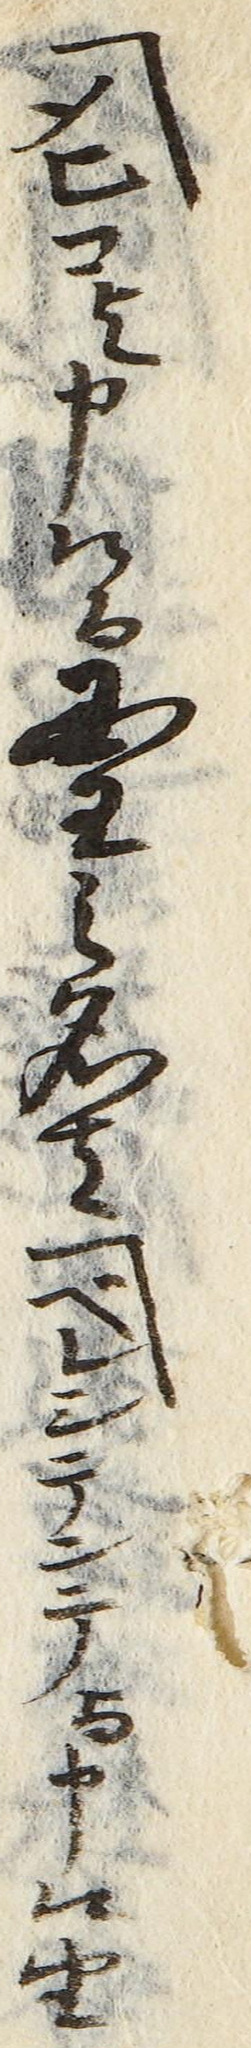「メヒコと申候而国主之名者「ベレシテンテと申候由
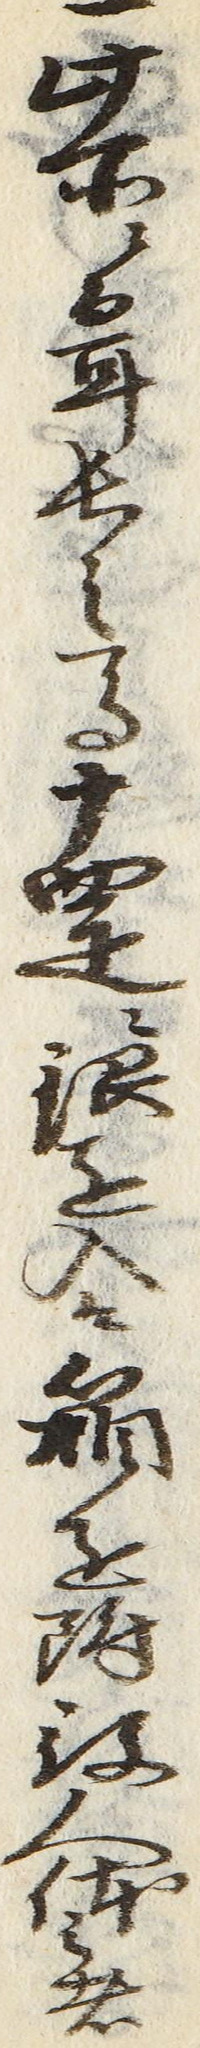一此所ニ而耳長之馬十四疋ニ銀を入候箱を附役人体之者
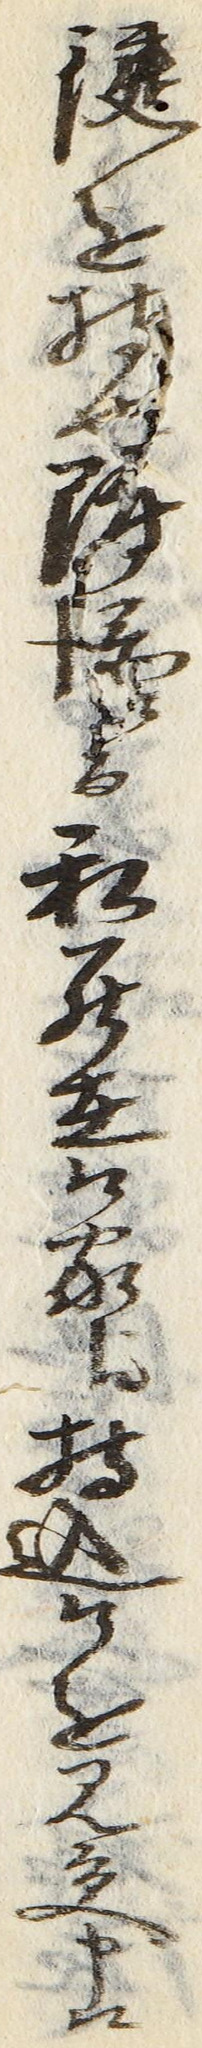鍵を持せ附添ニ而私罷在候家江持込候を見受申候
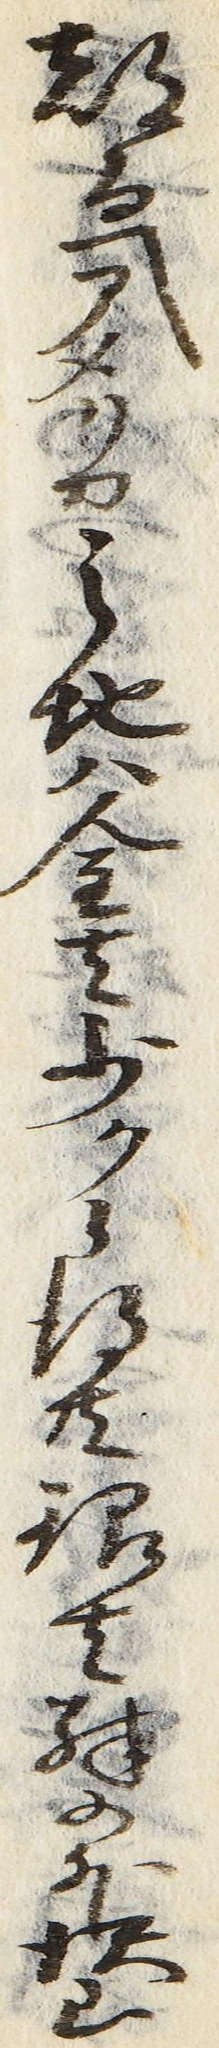都而「アメリカ之地ハ金者少ク候得共銀者殊の外沢山
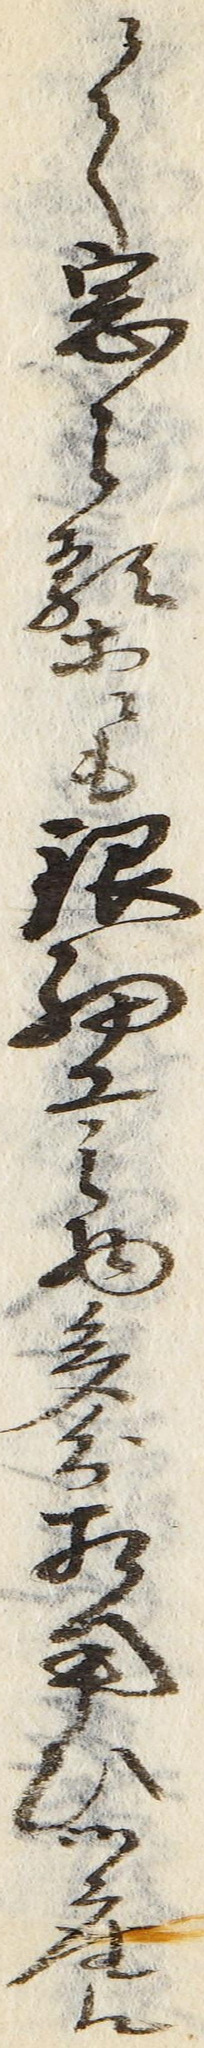ニて窓之類等ニも銀細工之物多分相用ひ御座候
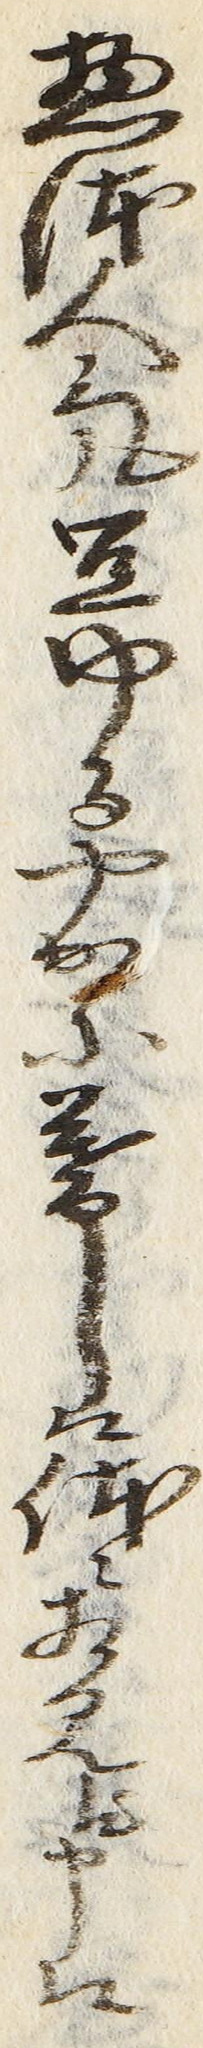惣体人気宜ゆるやかに暮し候体ニ相見江申候
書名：漂流人善助聞書
